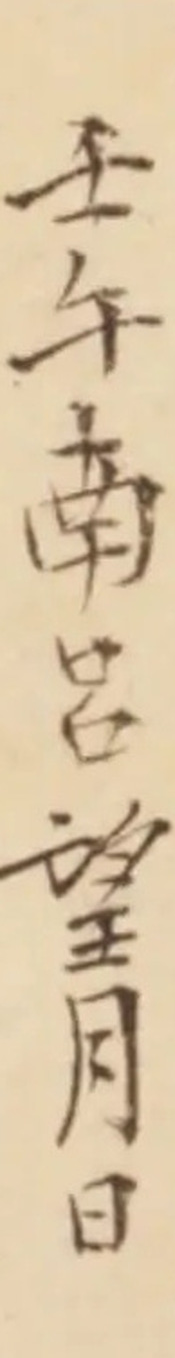壬午南呂望月日
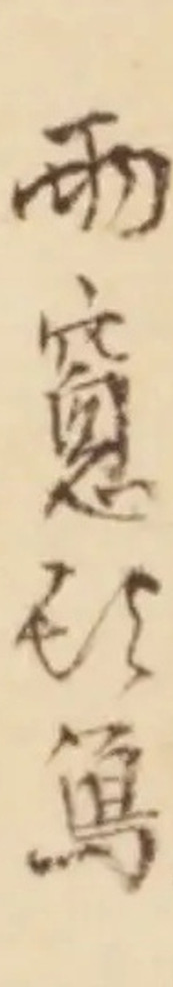雨窓頓写
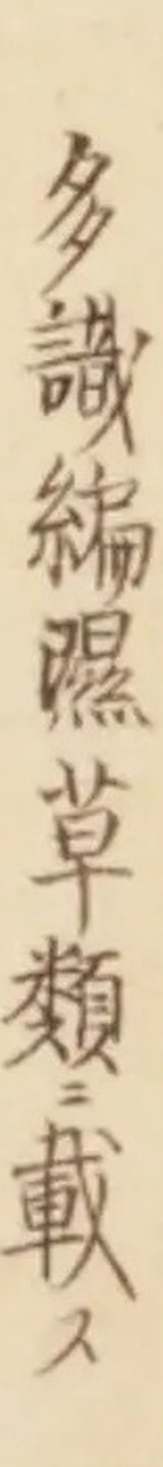多識編隰草類ニ載ス
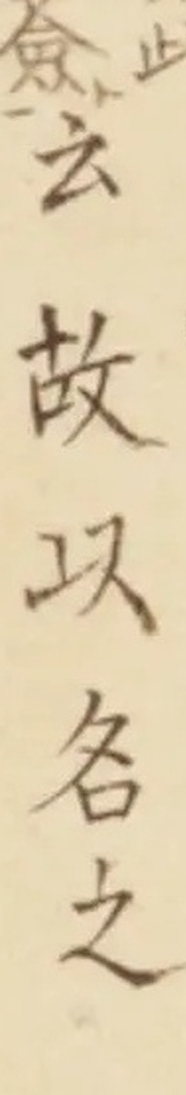云故以名之

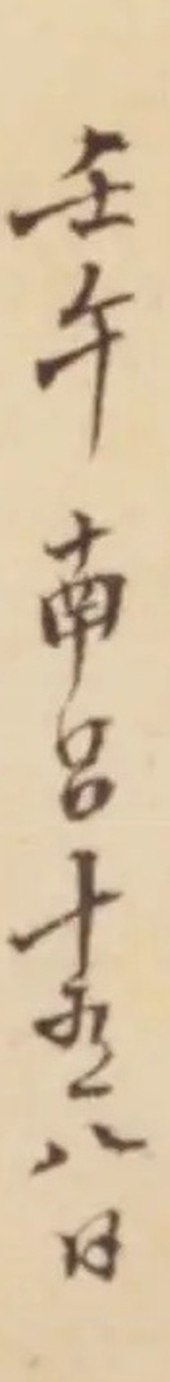壬午南呂十有八日
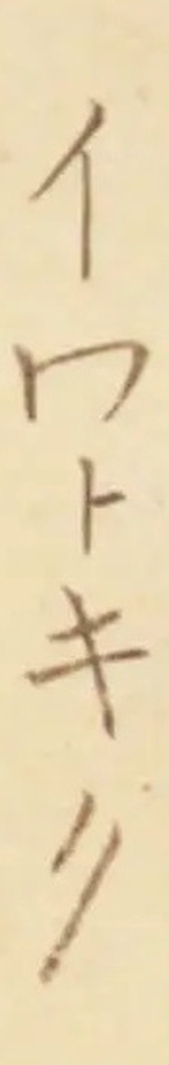イワトキク
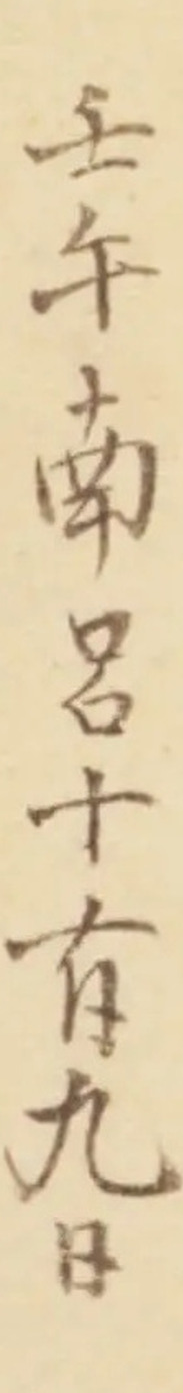壬午南呂十有九日

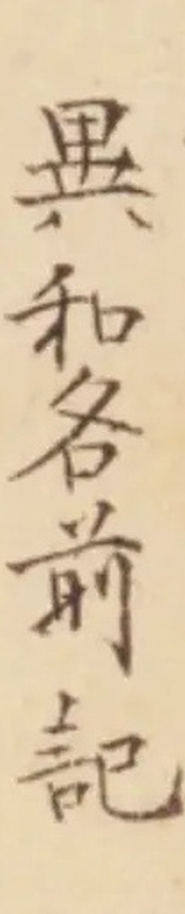異和名前記
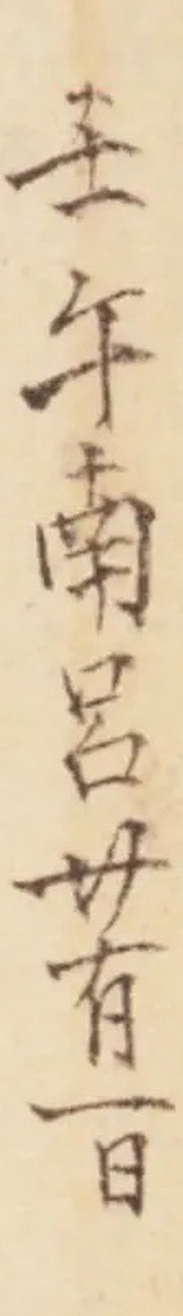壬午南呂廿有一日
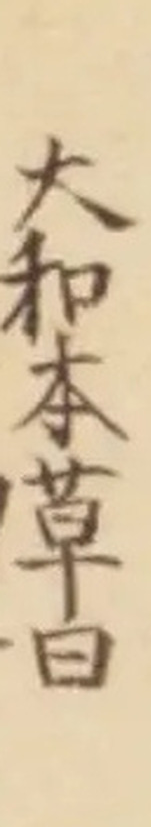大和本草曰
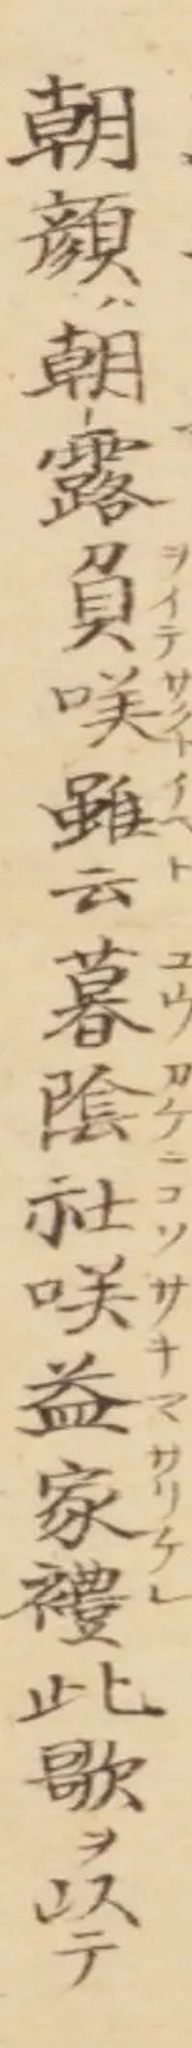朝顔朝-露負咲雖云暮陰社咲益家礼此歌以テ
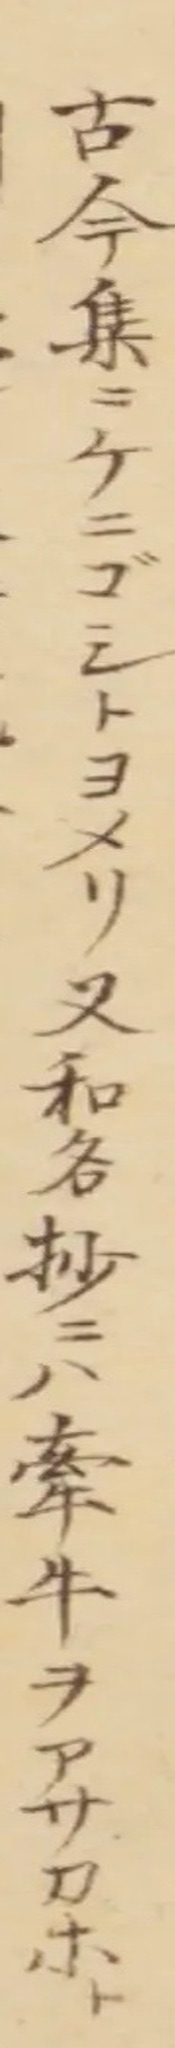古今集ニケニゴシトヨメリ又和名抄ハ牽牛ヲアサカホ
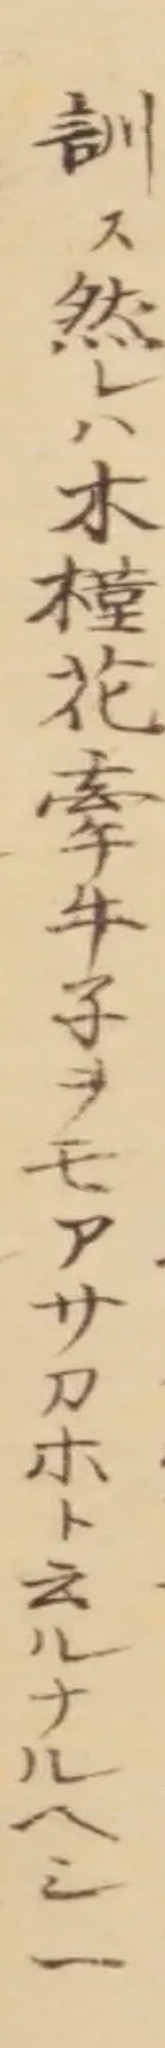訓然レハ木槿花牽牛子ヲモアサカホト云ルナルヘシ一
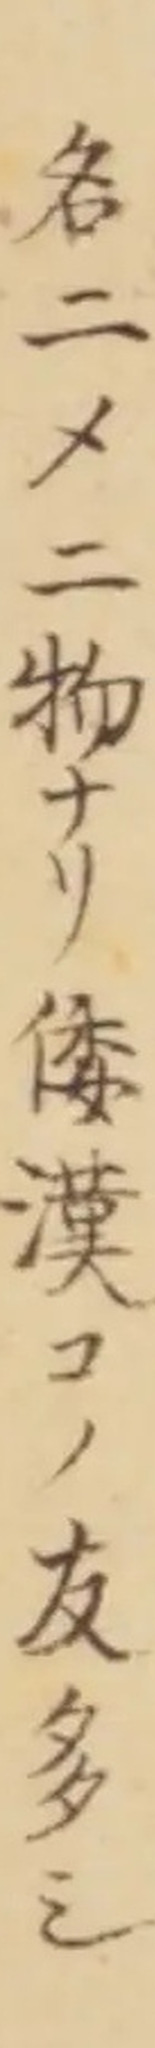名ニシテ二物ナリ倭漢コノ友多シ

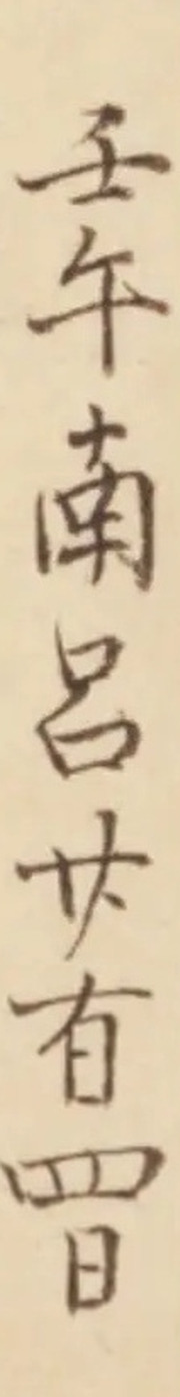壬午南呂廿有四日

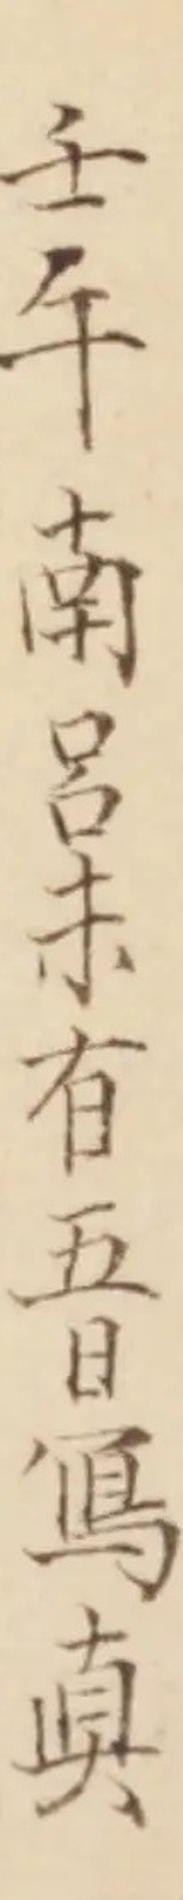壬午南呂未有五日写真
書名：梅園草木花譜秋之部. 1
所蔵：国立国会図書館 National Diet Library, JAPAN
